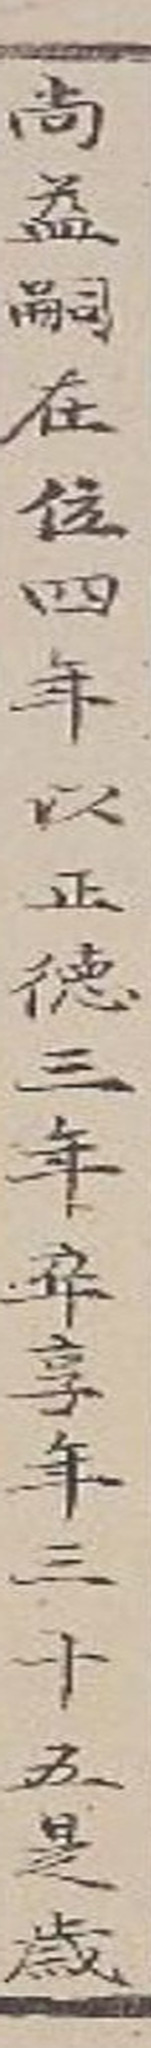尚益嗣在位四年以正徳三年卒享年三十五是歳
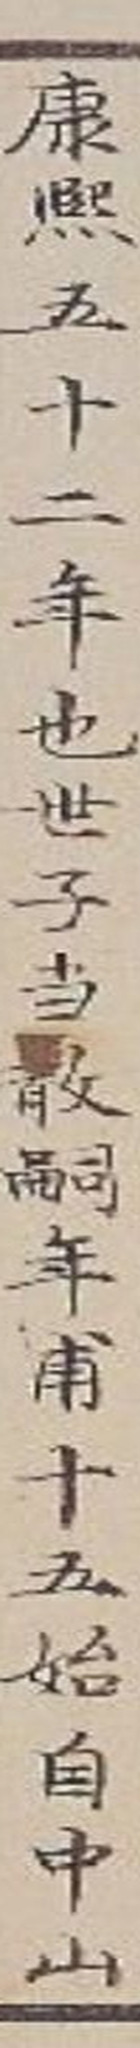康熙五十二年也世子当散嗣年甫十五始自中山
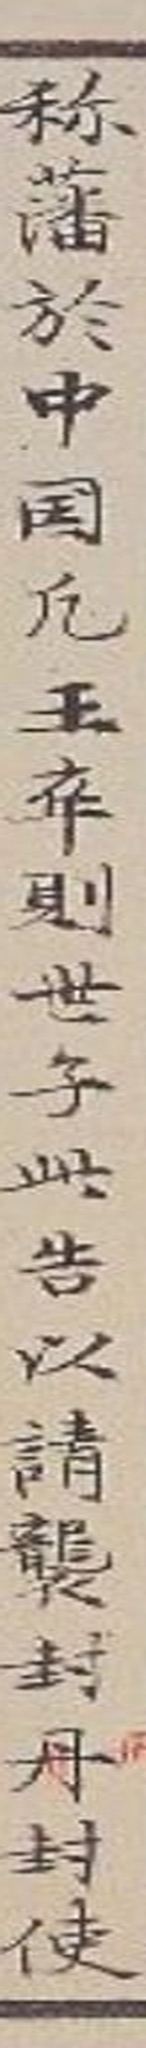称藩於中国凡王卒則世子此告以請襲封丹冊封使
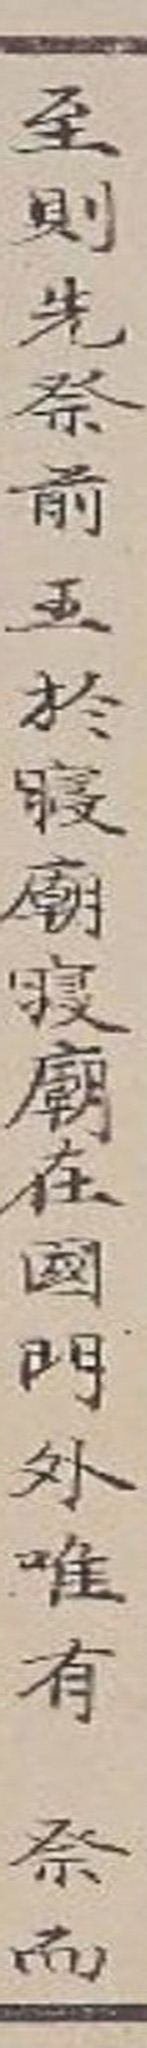至則先祭前王於寝廟寝廟在国門外唯有祭而
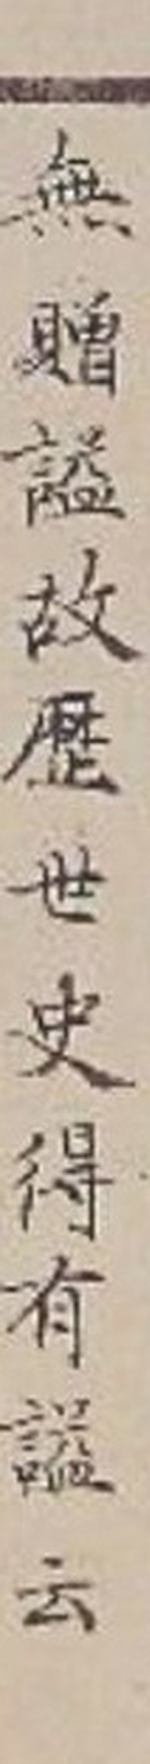無贈諡故歴世末得有諡云

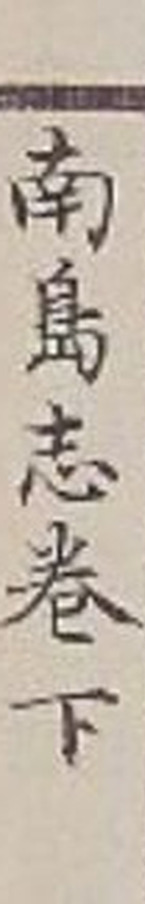南島志巻下
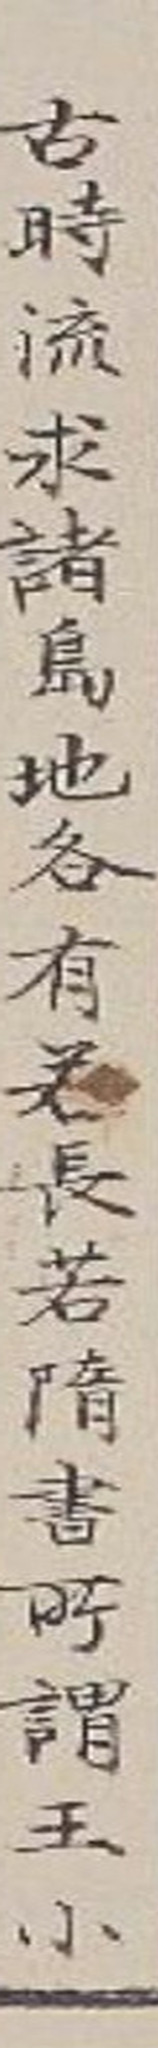古時流求諸島地各有若長若隋書所謂王小
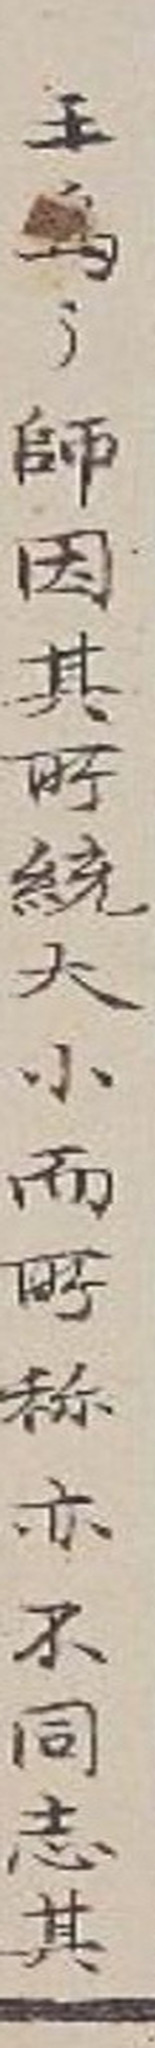王島了師因其所統大小而所称亦不同志其
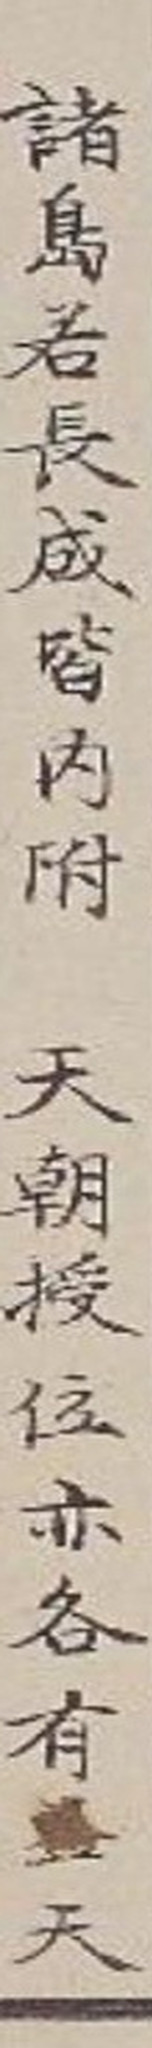諸島君長成皆内附天朝授位亦各有天
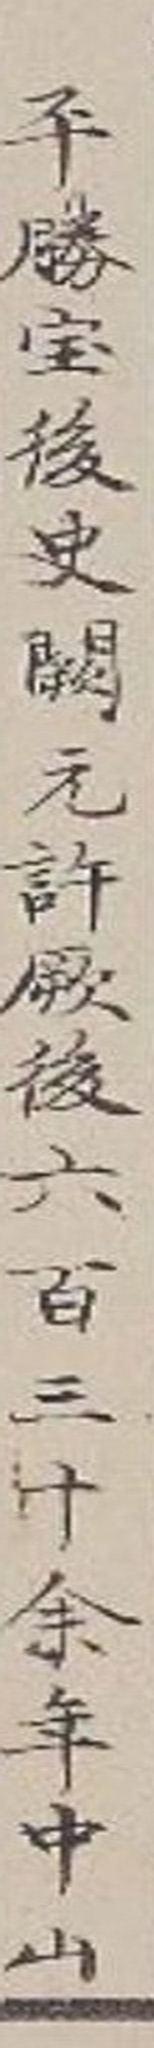平勝宝後史闕元許厥後六百三十余年中山
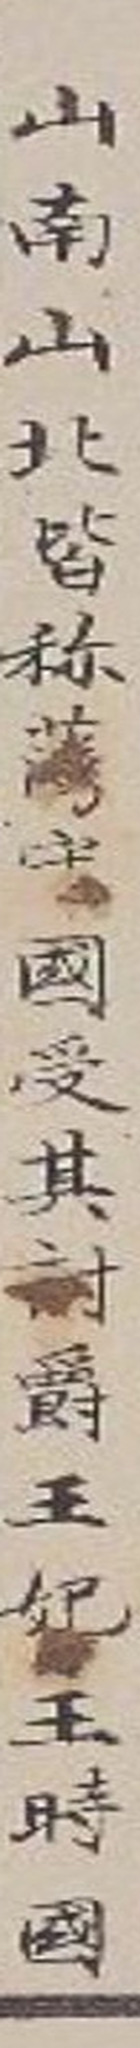山南山北皆称中国受其討爵王妃王時国
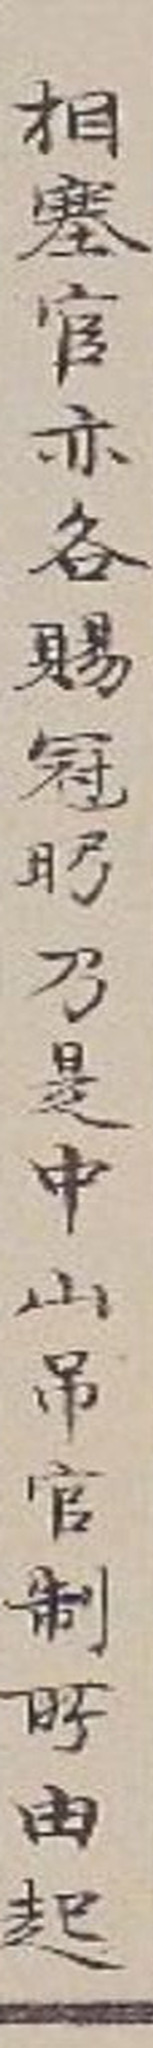相塞官亦各賜冠服乃是中山吊官制所由起
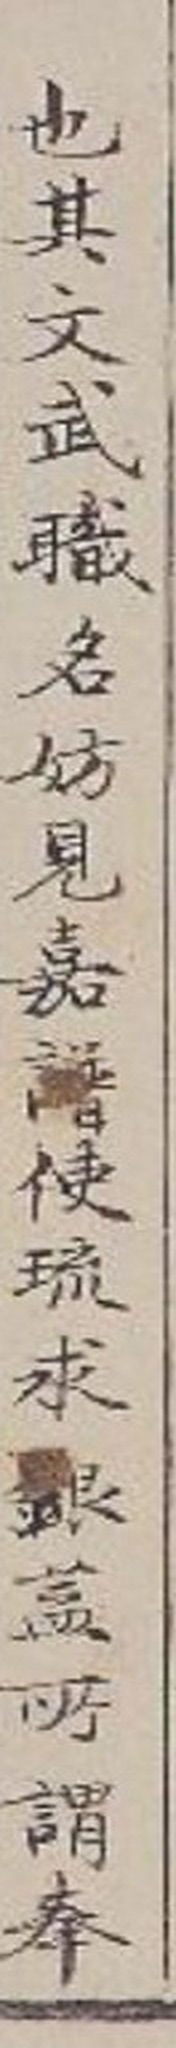也其文武職名妨見嘉譜使琉求銀蓋所謂奉
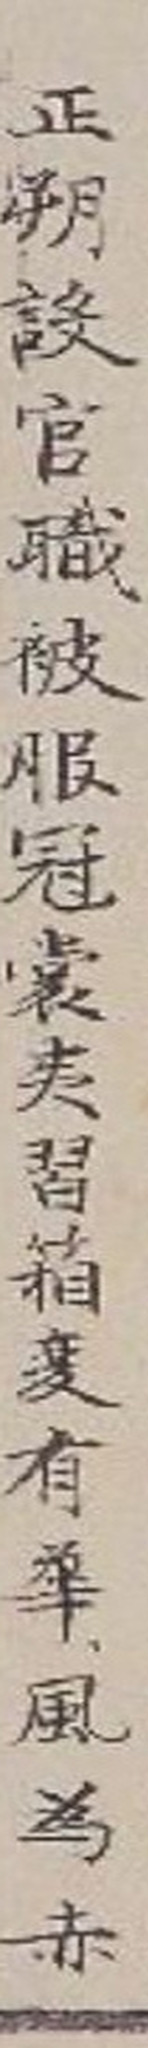正朔設官職被服冠裳夷習箱変有華風焉赤

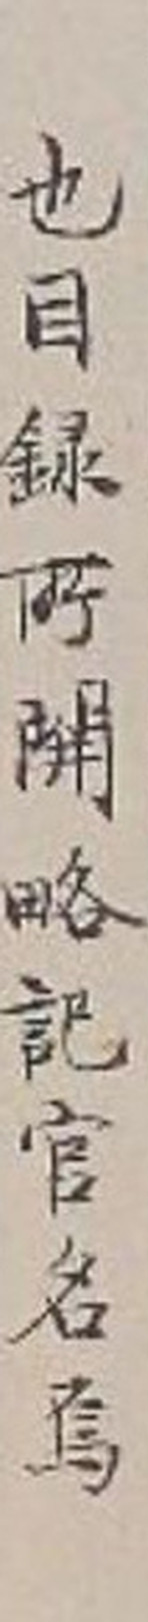也目録所開略記官名焉
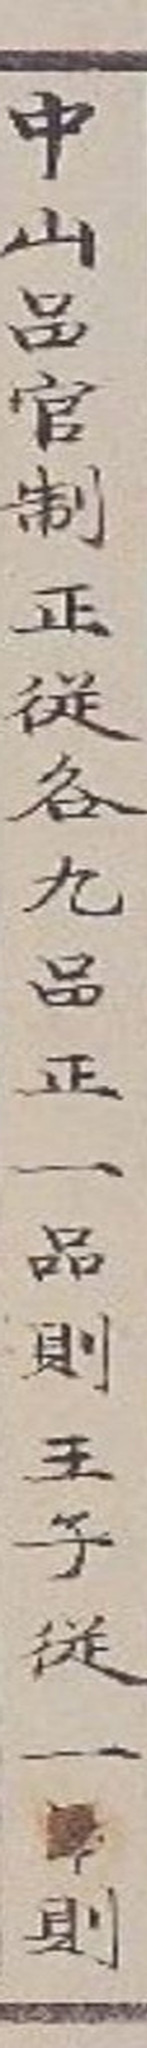中山品官制正従各九品正一品則王子従一則
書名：南島志 全
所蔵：University of the Ryukyus Library
